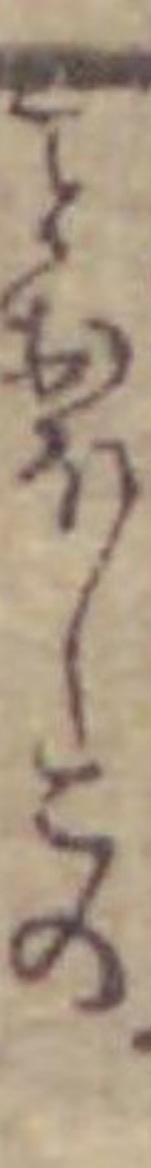ことおほしこの
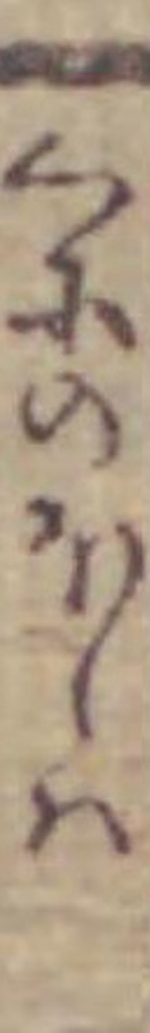くにのほしは
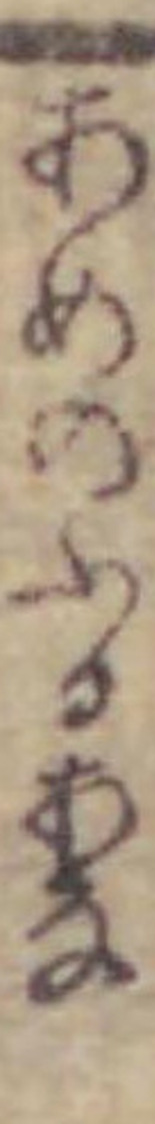あめのふるあな
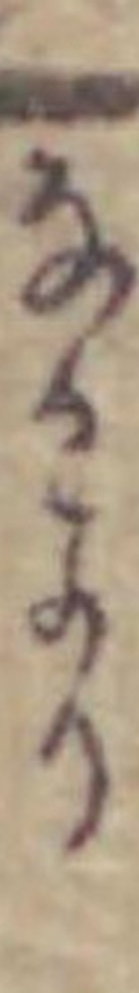なかより
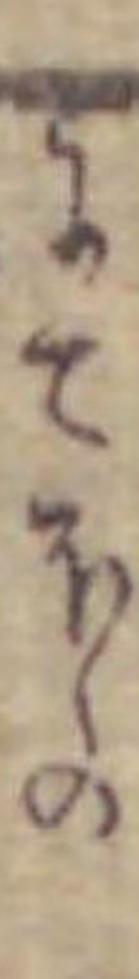にてほしの
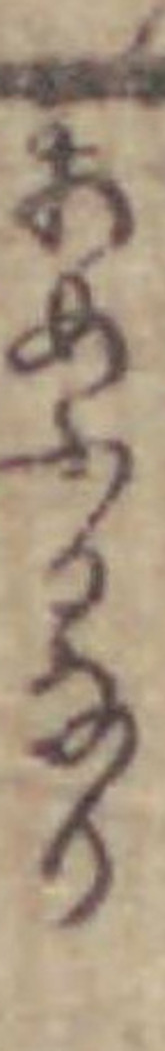あめふるなり
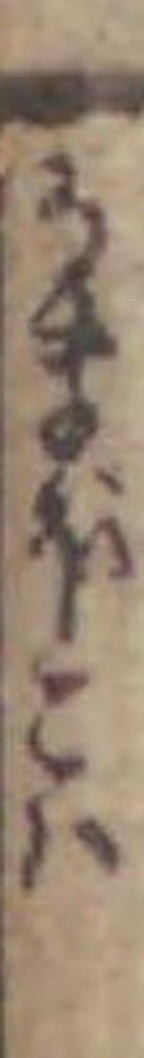かまぼこは
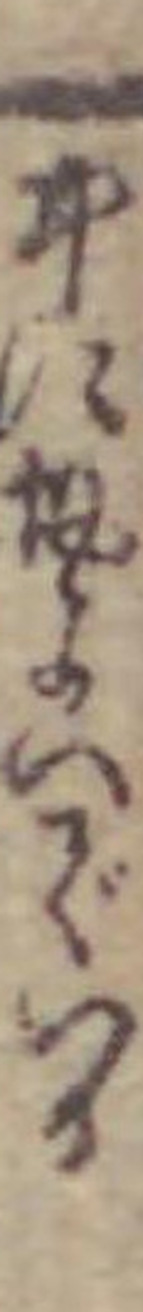中におよいでいる
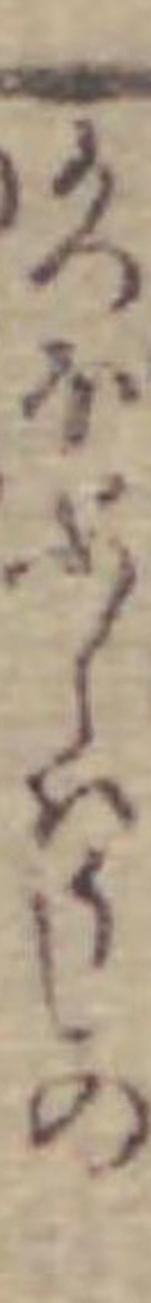かつほぶしはうしの
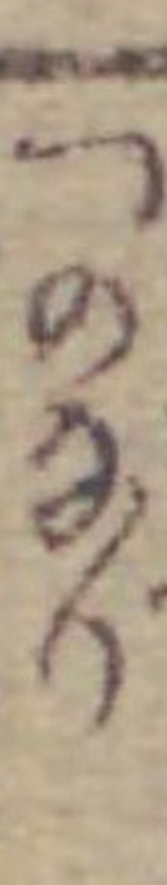つのなり
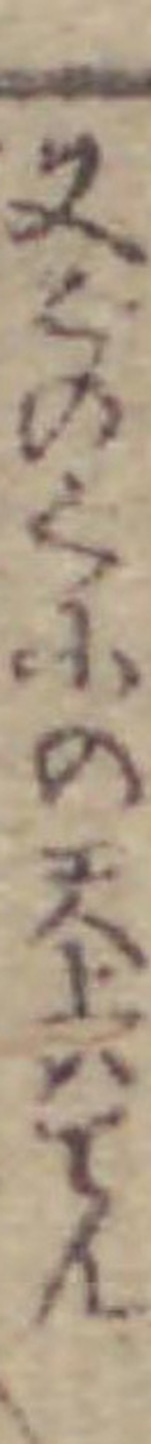又このくにの天上はてん
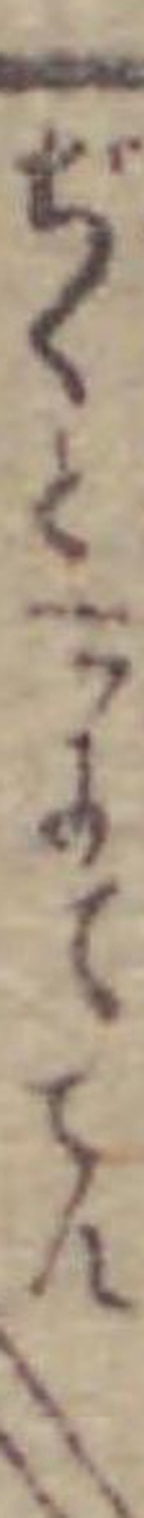ぢくと一つにててん
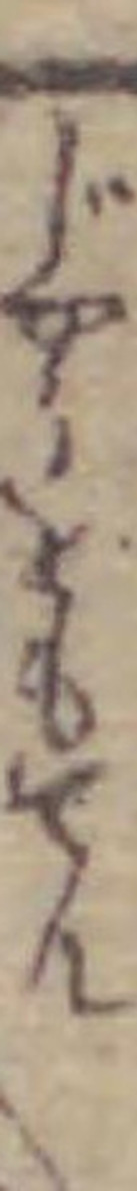じやうをもてん
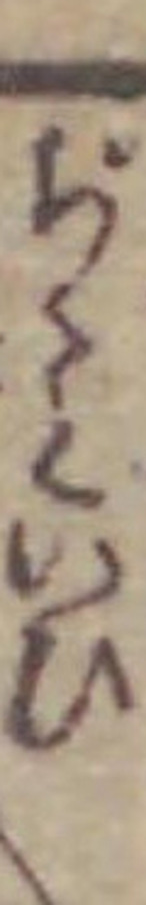ぢくといひ
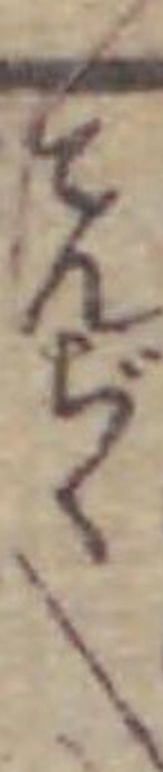てんぢく
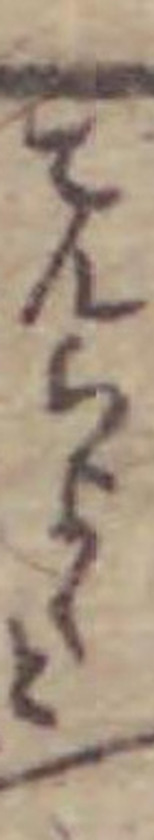てんちよくと
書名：和荘兵衛後日話 : 3巻
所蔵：国立国会図書館 National Diet Library, JAPAN
